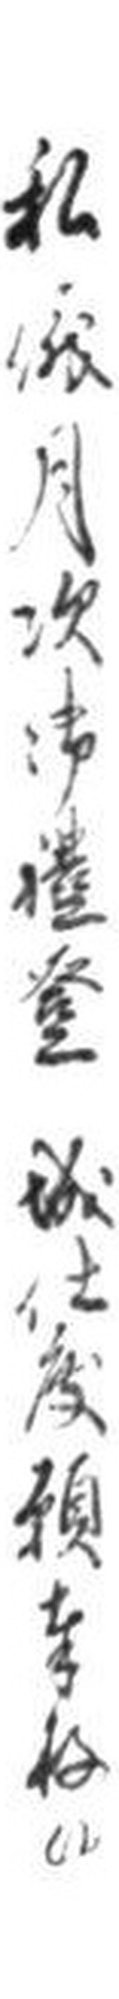私儀月次御礼登城仕度願奉存候
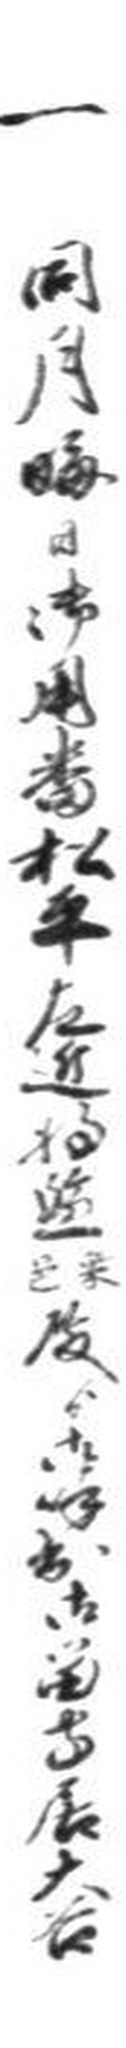一同月晦日御用番松平左近将監乗邑殿ゟ御呼出御留守居大谷
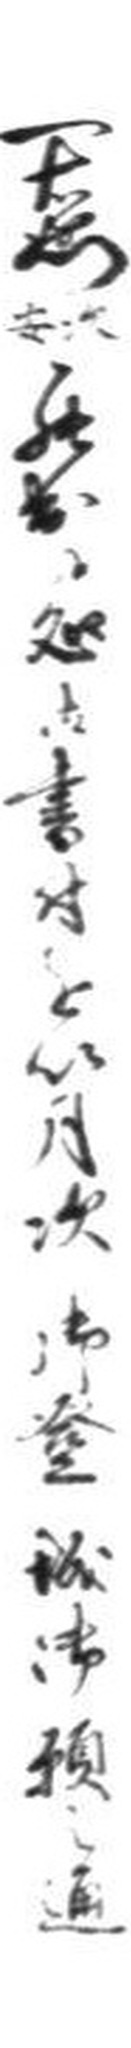一右衛門次安罷出候処御書付を以月次御登城御願之通
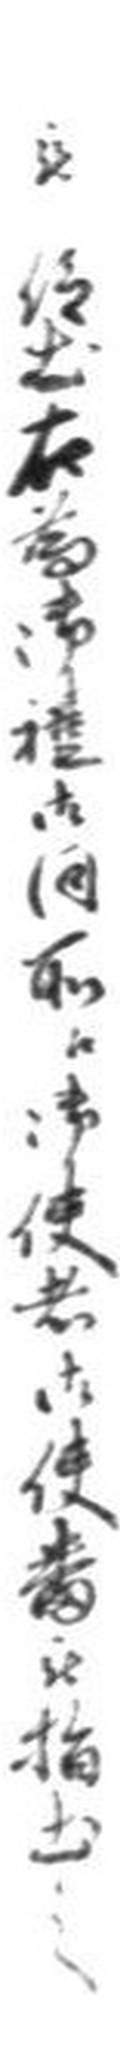被仰出右為御礼御同所江御使者御使番被指出之
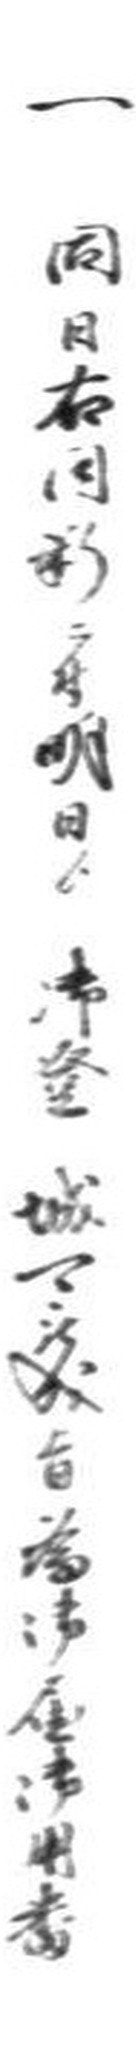一同日右同断ニ付明日ゟ御登城可被成旨為御届御用番
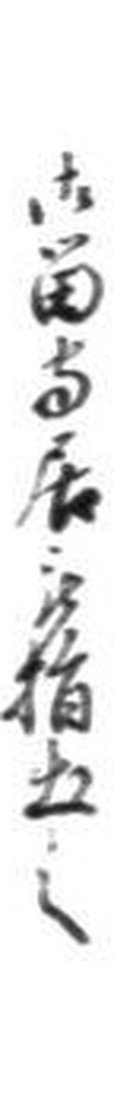御留守居被指出之
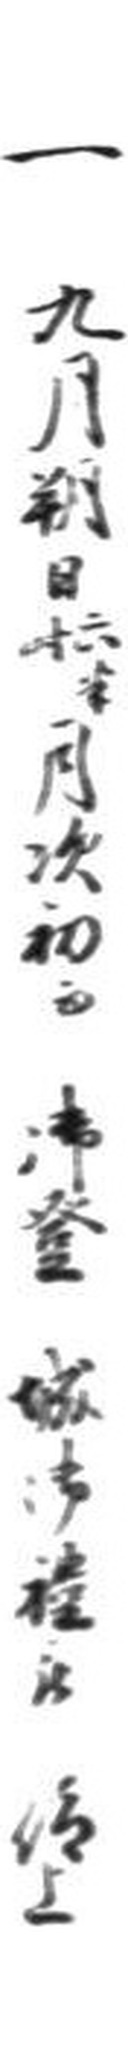一九月一日六半時月次初而御登城御礼被仰上
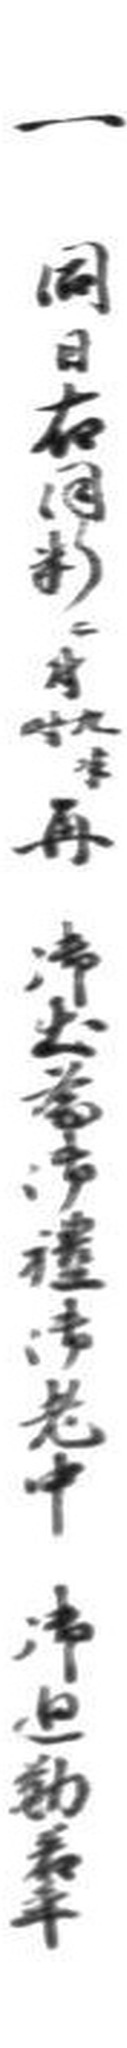一同日右同断ニ付九半時再御出為御礼御老中御廻勤若年
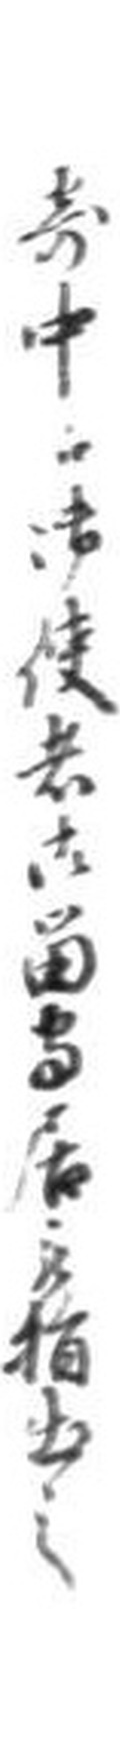寄中江御使者御留守居被指出之
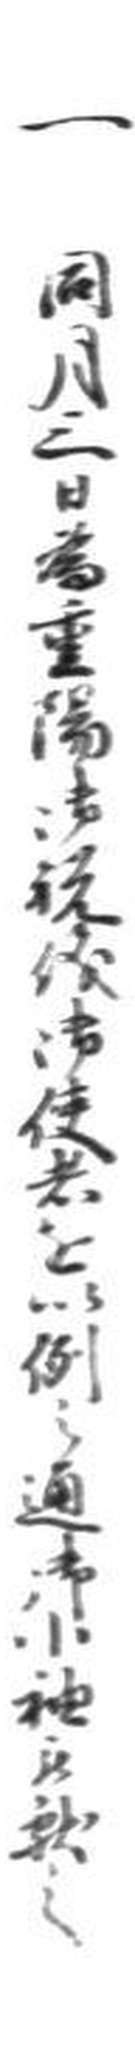一同月三日為重陽御祝儀御使者を以例之通御小袖被献之
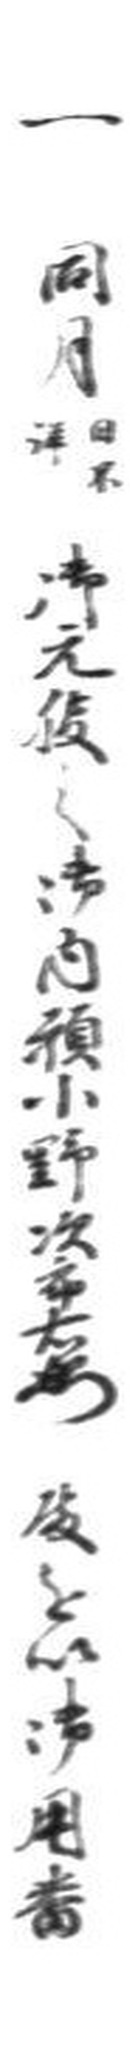一同月日不詳御元服之御内願小野次郎右衛門殿を以御用番
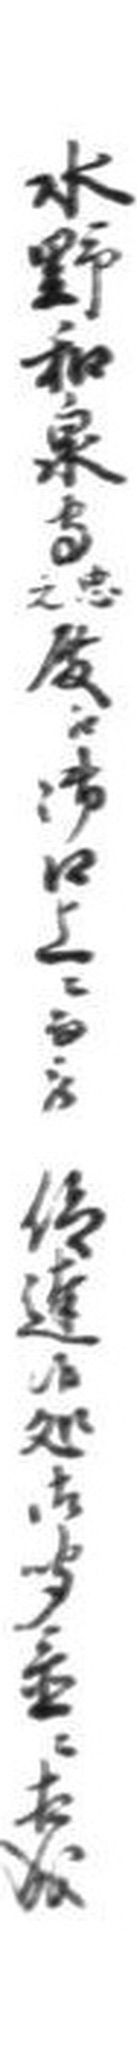水野和泉守忠之殿江御口上ニ而被仰達候処御聞置ニ相成

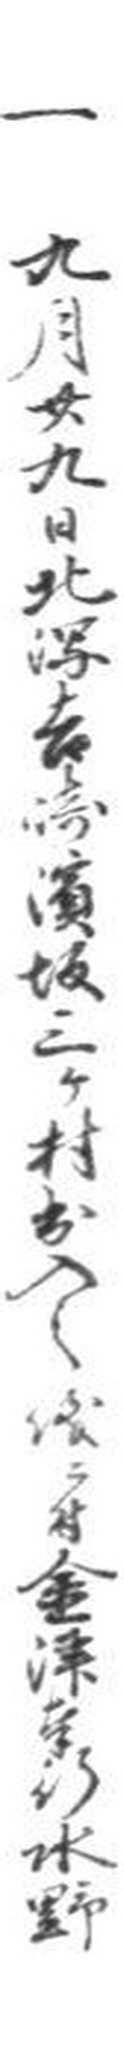一九月廿九日北潟吉崎濱坂三ケ村出入之儀ニ付金津奉行水野
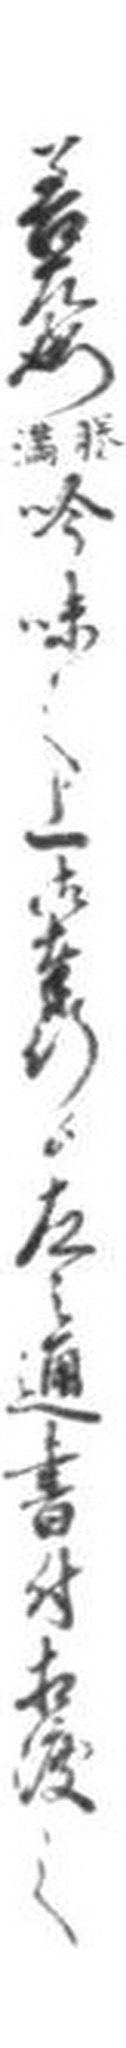善左衛門勝満吟味之上御奉行所ゟ左之通書付相渡之
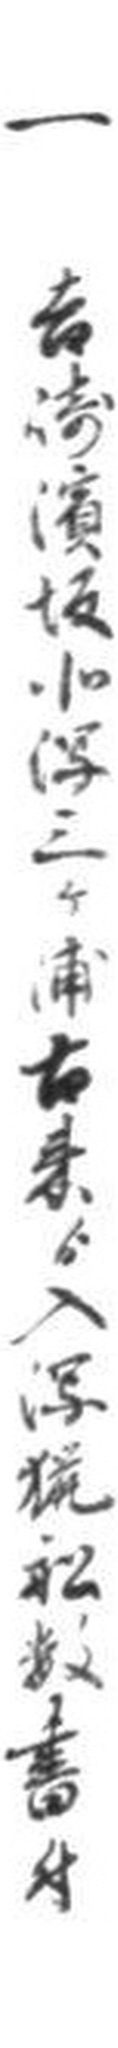一吉崎濱坂北潟三ケ浦古来ゟ入潟猟船数書付
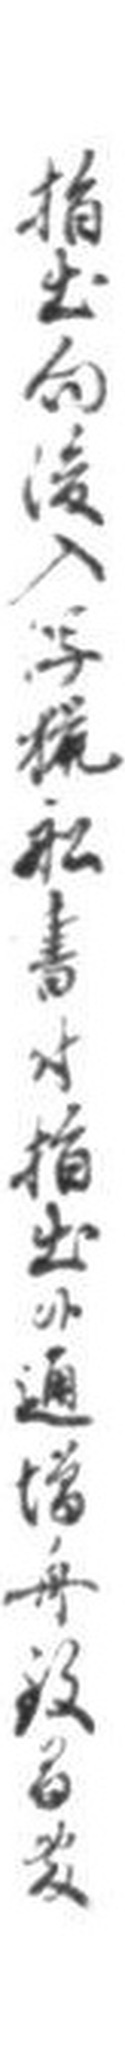指出向後入潟猟船書付指出候通増舟致間敷
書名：家譜 四十 宗矩公 従享保十一年到享保十二年
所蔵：福井県文書館 Fukui Prefectural Archives
